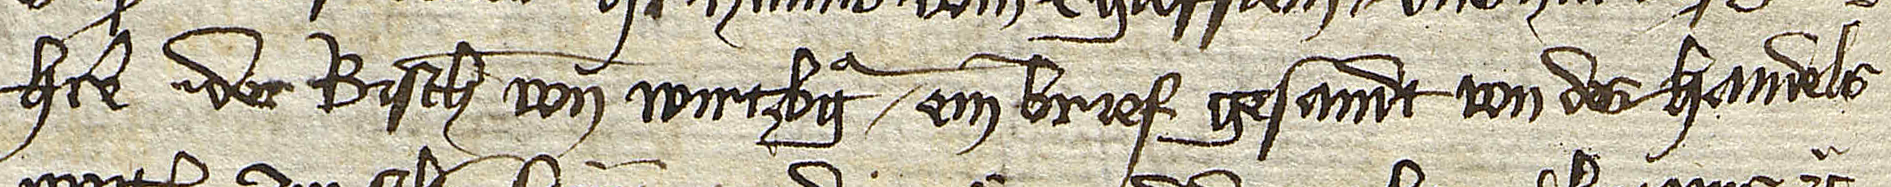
hr*e ~ der Biſch* von wircʒb*g / ein brief geſandt von des handels
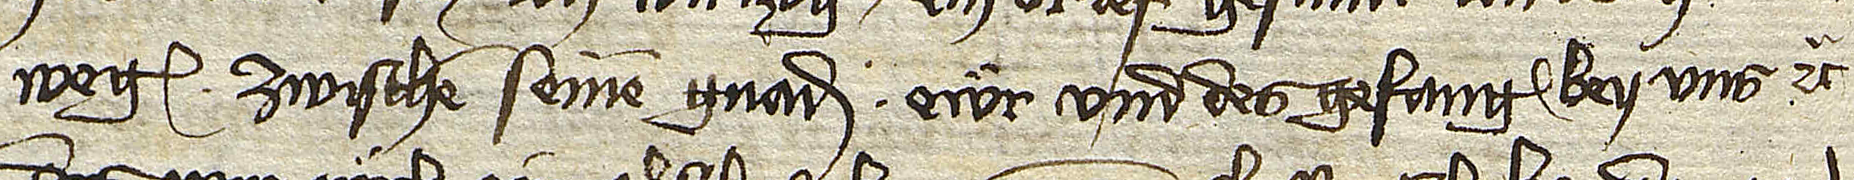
weg* . ʒwiſche* ſeine* gnad* . ewr vnd des gefang* bey vns ec*
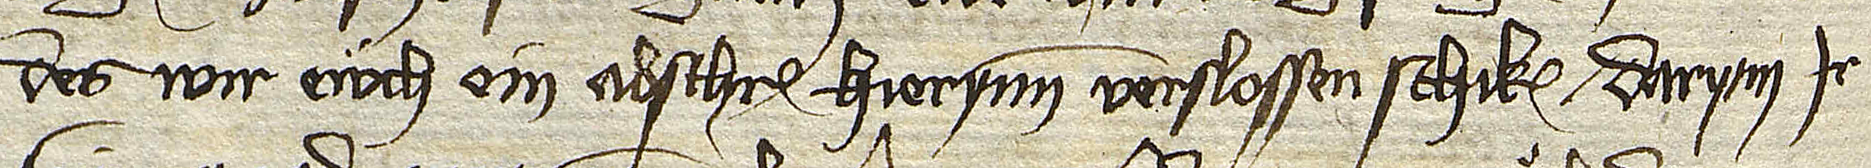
des wir ewch ein abſchr* hierynn* verſloſſen ſchik* / Darynn Ir
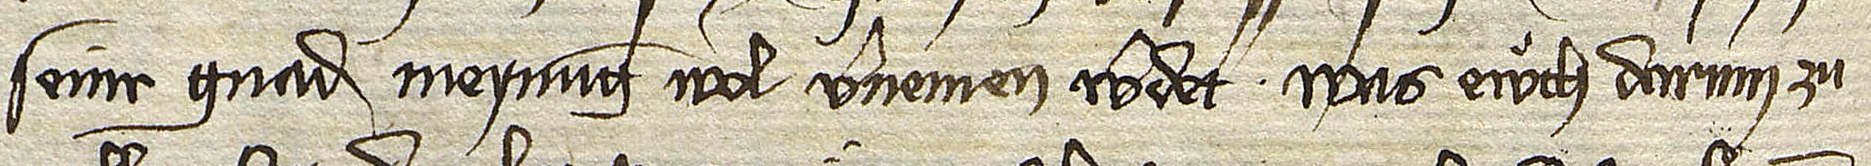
ſeinr gnad* meynug* wol v*nemen w*det . was ewch darinn ʒu
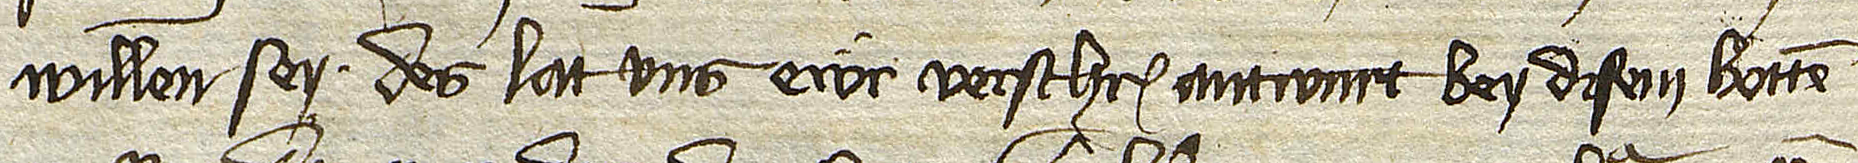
willen ſey . des lat vns ewr verſchr* antwurt bey diſem botte*
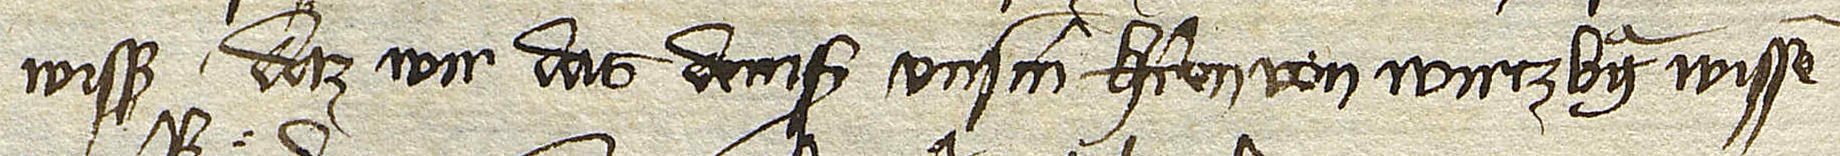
wiſſ* / Daʒ wir das demſ* vnſm* hr*en von wircʒb*g wiſſe*
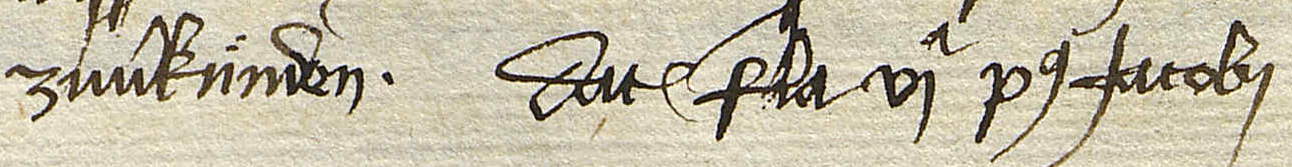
ʒuu*künden . Dat* fi*a vi* p* Iacobi
